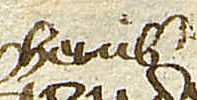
herüb*
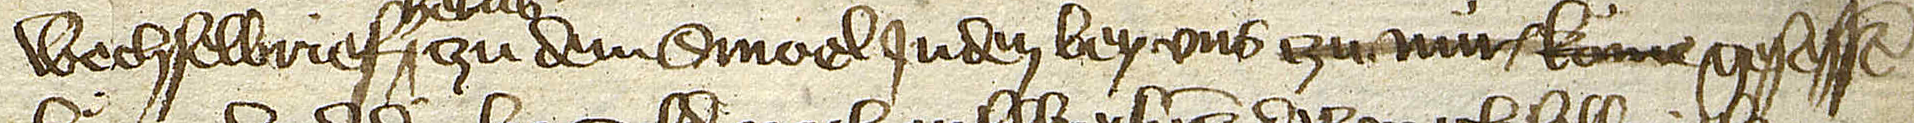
Wechſelbrief cʒu dem Smoel Iuden bey vns cʒu Nür* köme geſeſſe*
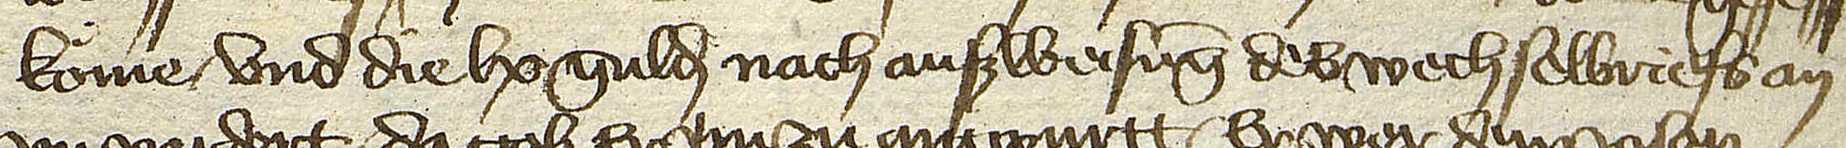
köme / vnd die lx guld* nach auſʒweiſu*g des wechſelbriefs an
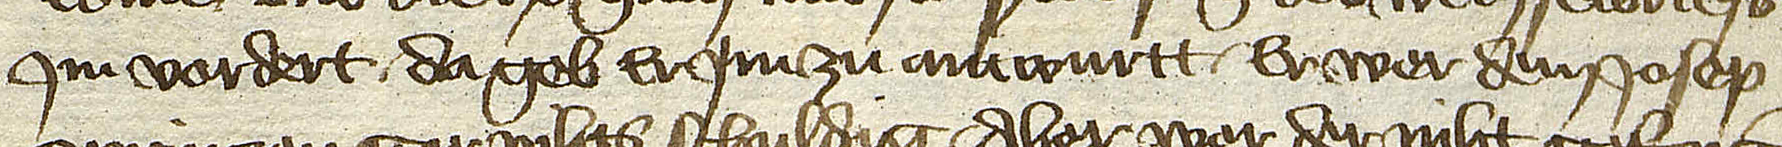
Im vordert / da geb Er Im cʒu antwurtt / Er wer dem Ioſep
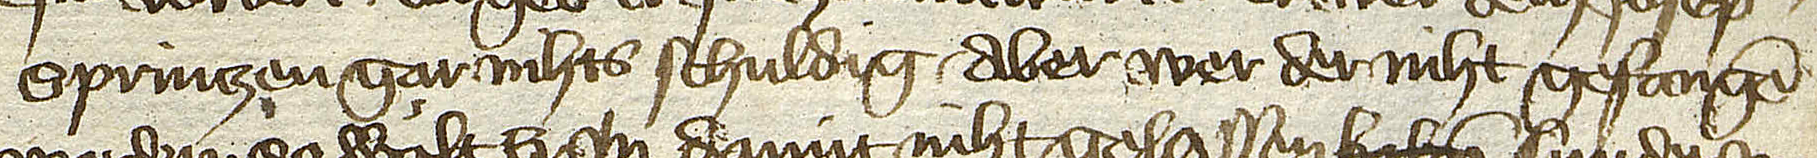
Sprincʒen gar nihts ſchuldig / Aber wer der niht gefange*
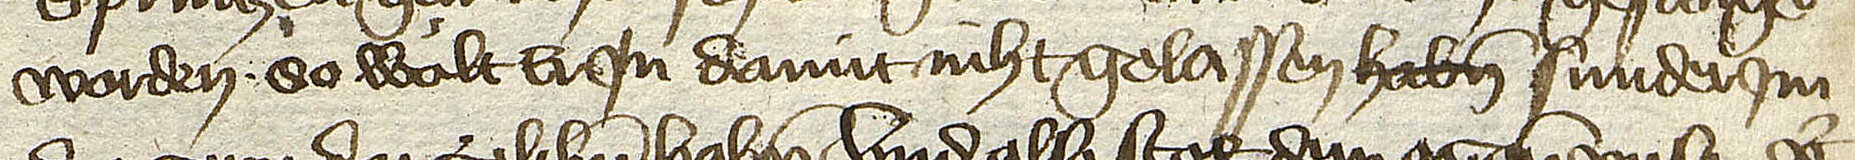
worden . So wölt Er In damit niht gelaſſen hab*n ſunder Im
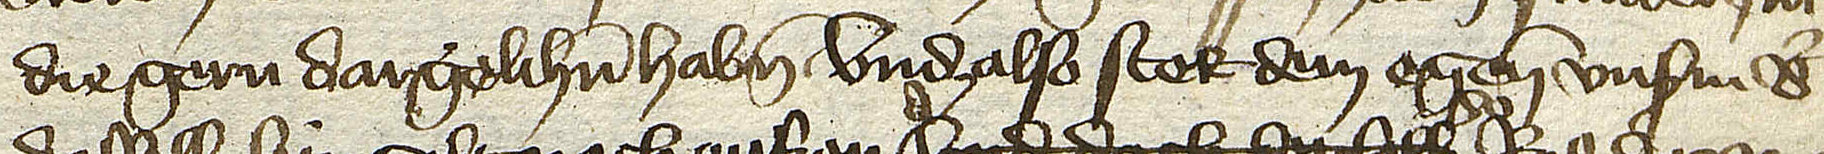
die gern dargelich*n hab*n / Vnd alſo ſtee dem egen* vnſ*m B*
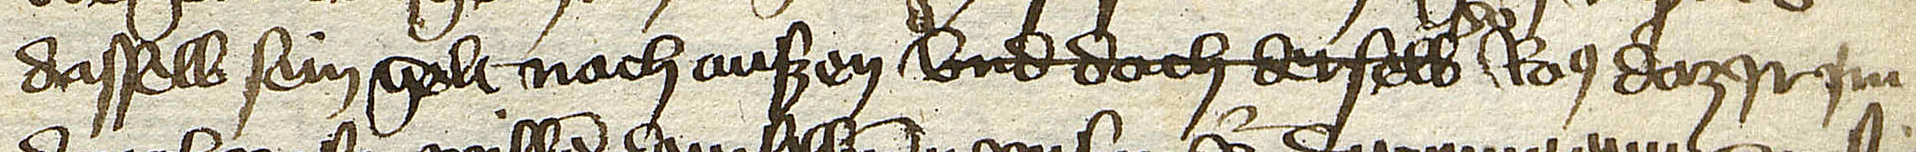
daſſelb ſein gelt noch auſʒen / Vnd doch derſelb Ro* daʒ Ir Im
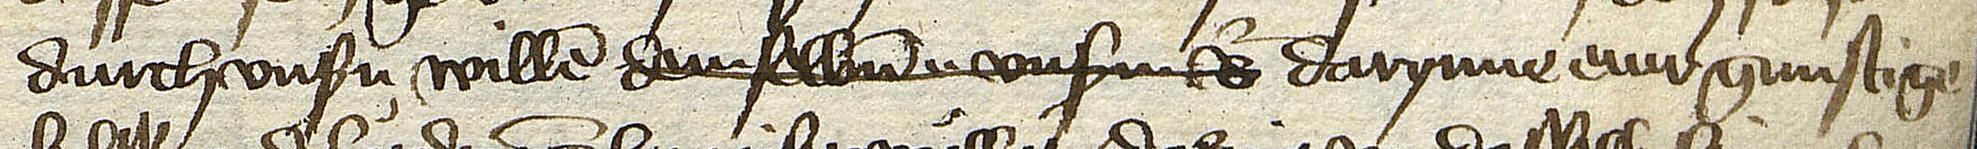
durch vnſ*n wille* demſelb ~ vnſ*m B* darynne ewr gunſtige
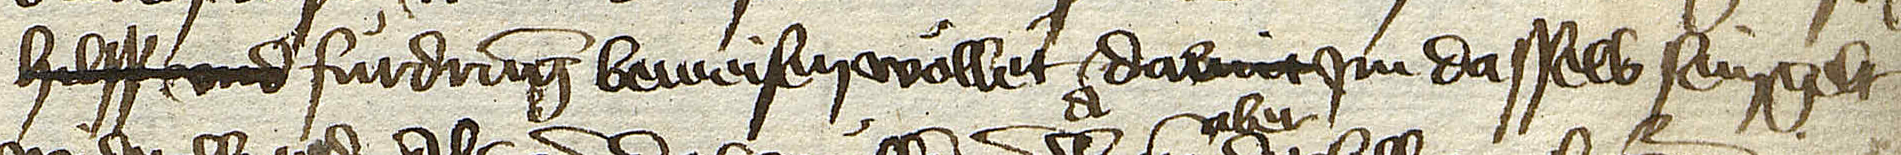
hilff vnd fürdru*g beweiſen wöllet / das mit Im daſſelb ſein gelt
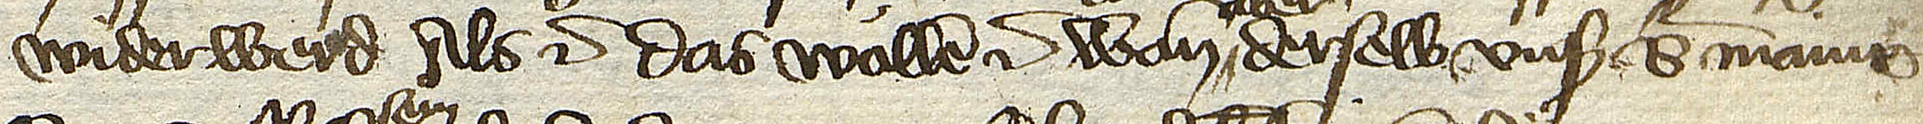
wider werd Als ec* das wöllen ec* Wan derſelb vnſ* . B* maine
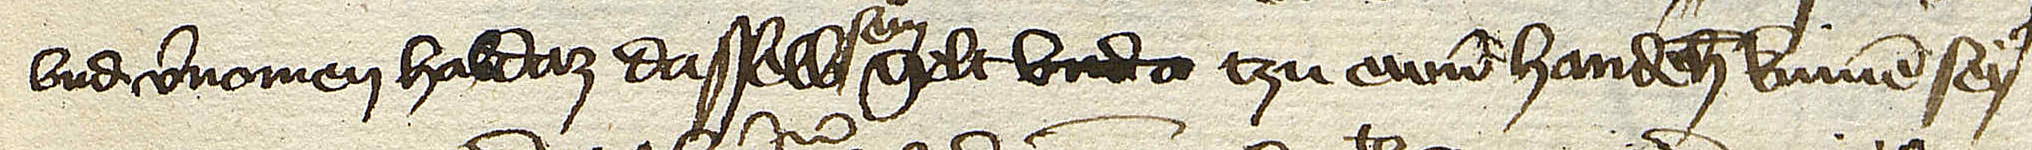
vnd v*nomen hab daʒ daſſelb gelt vnd a cʒu ew*n handen kume* ſey
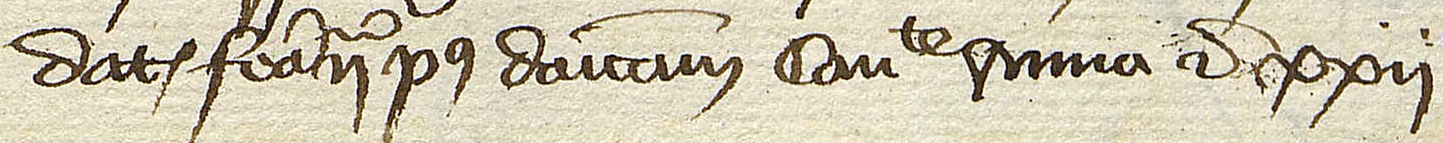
Dat* fea* ii* p* doicam* Can* Anno ec* xxii*
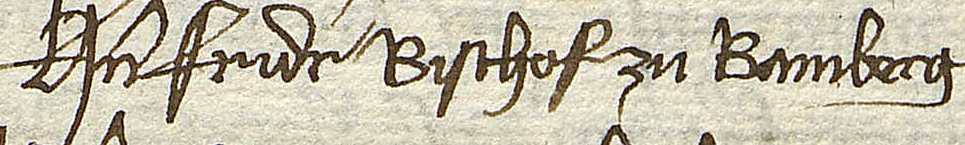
H*n Fridr* Biſchof ʒu Bamberg
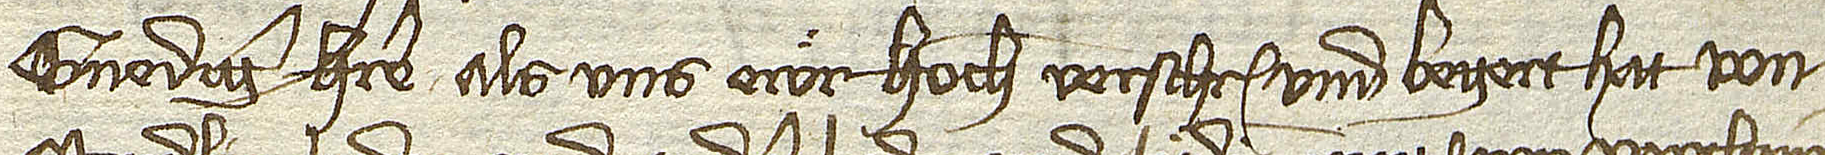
Gnedig* h*re / als vns ewr hoch* verſchr* vnd begert hat von
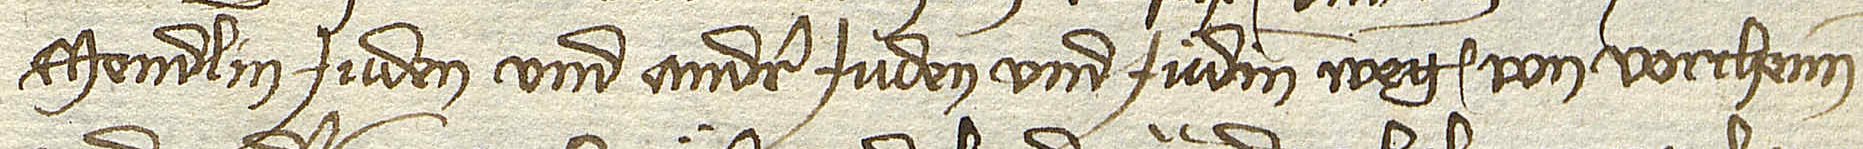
Mendlin Iuden vnd and*r Iuden vnd Iüdin weg* von vorcheim
